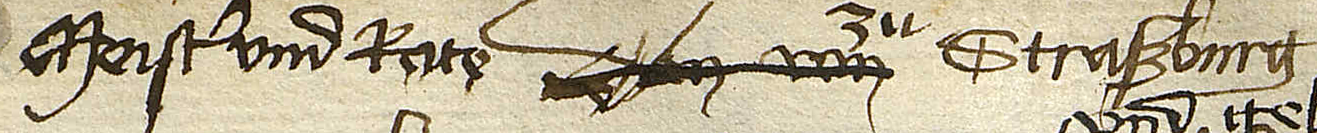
Meiſt* vnd Rate Den von Straſʒburg
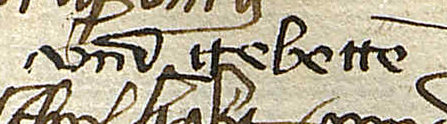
vnd gebette*
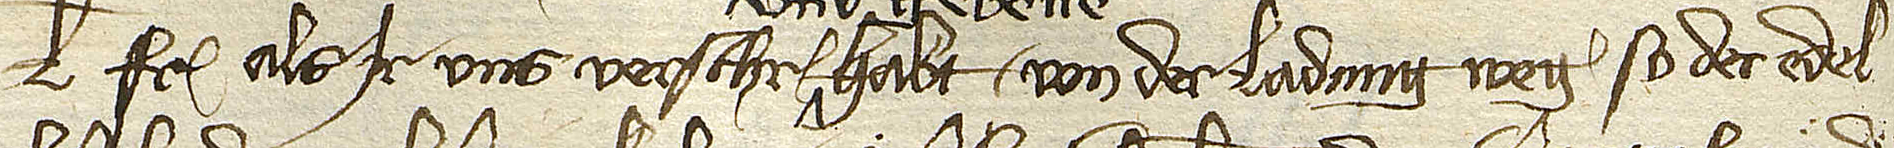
L* fr* als Ir vns verſchr* habt / von der ladung weg* ſo der edel
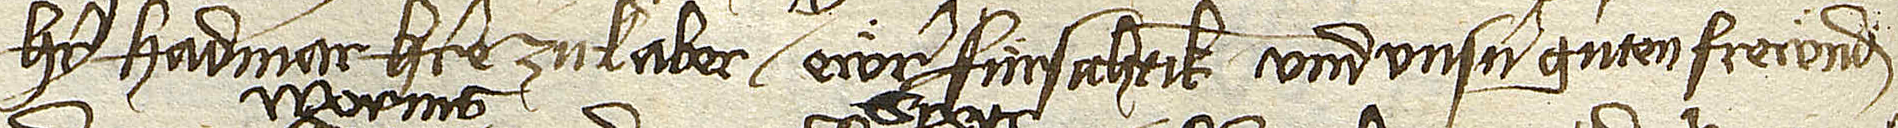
h*r hadmar h*re ʒu laber / ew*r fürſichtik* vnd vnſ*n guten frewnd*
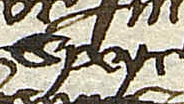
Speyr
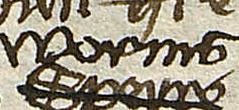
Worms
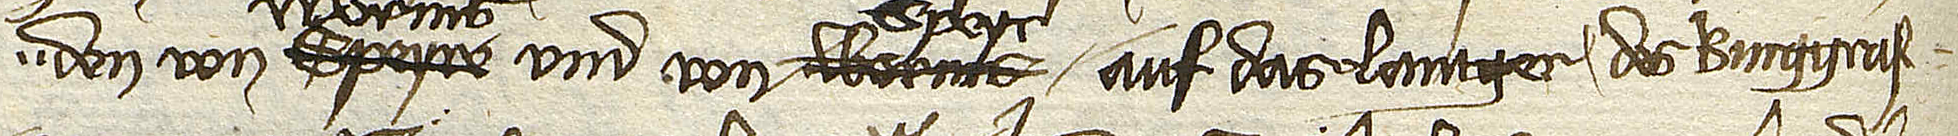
~ den Speyre vnd von Worms / auf das lantger* des Burggraf -
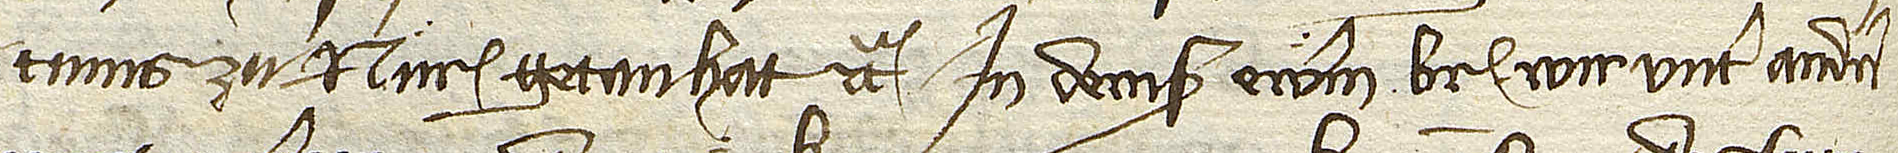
tums ʒu Nür* getan hat ec* / In demſ* ew*m br* wir vnt* and*n
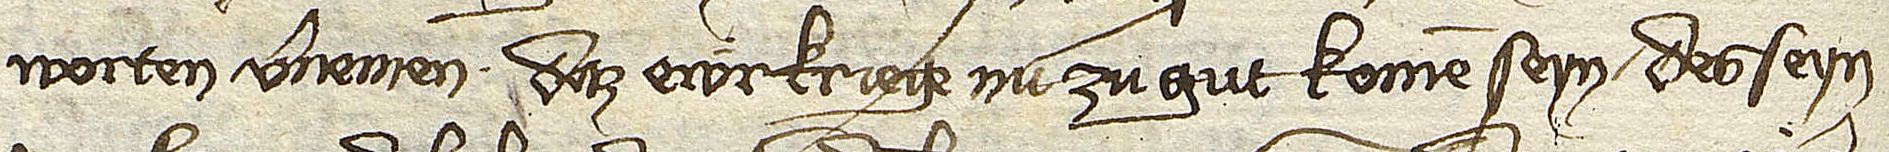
worten v*nemen . daʒ ewr kriege nu ʒu gut kome* ſeyn / Des ſeyn
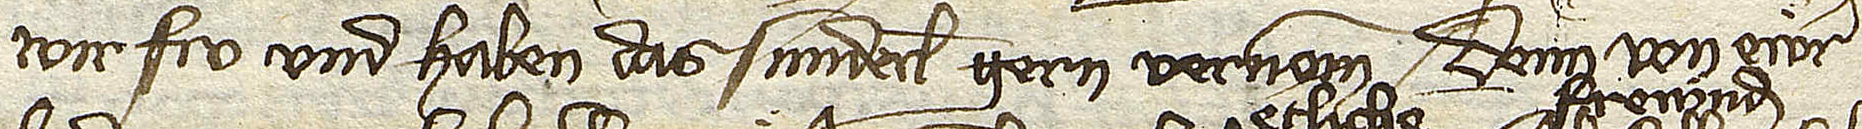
wir fro vnd haben das ſunderl* gern vernom* / Denn von ew*r
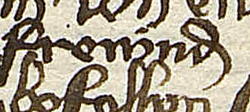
frewnd*
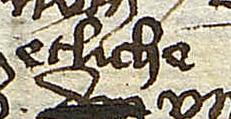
etliche*
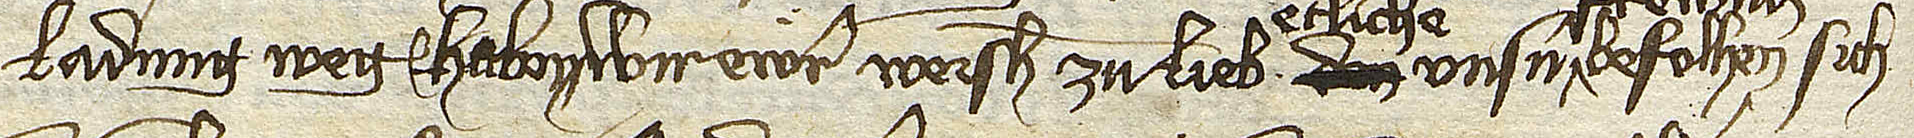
ladung weg* haben Wir ew*r weiſh* ʒu lieb . den vnſ*n befolhen ſich
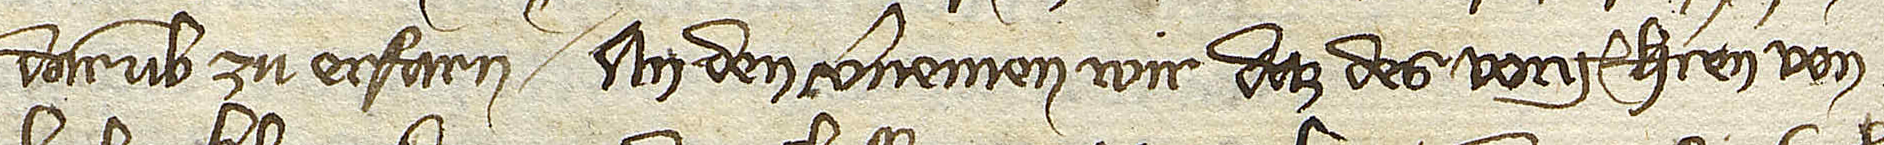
daru*b ʒu erfarn / An den v*nemen wir daʒ des vorg* h*ren von
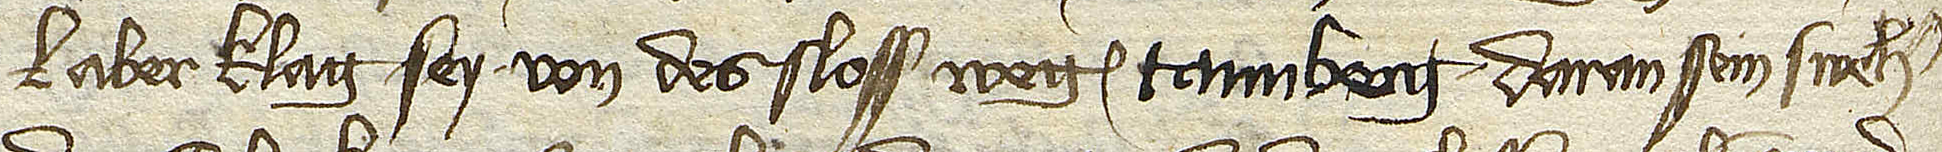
Laber klag ſey . von des ſloſſ weg* tannberg / Daran ſein ſweh*
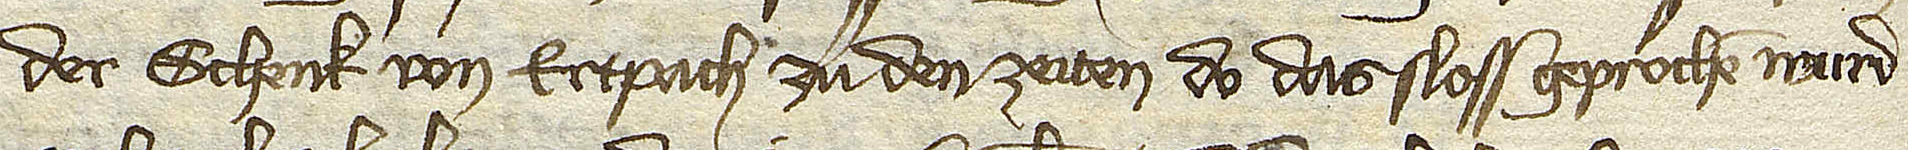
der Schenk von Ertpach ʒu den ʒeiten do das ſloſſ geproche* wurd
